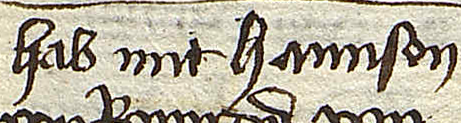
hab mit hannſen
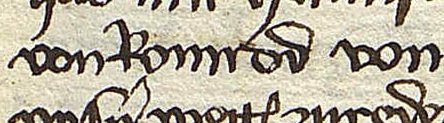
von Romrod von
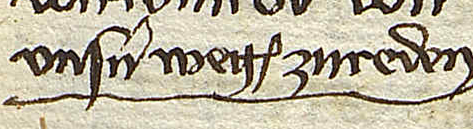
vnſn* weg* ʒureden
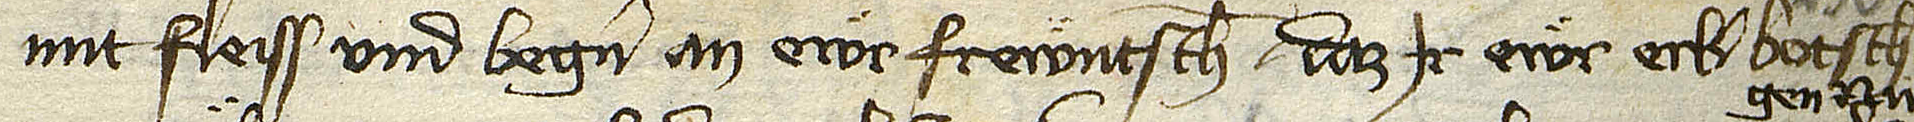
mit fleiſſ vnd begn* an eẅr freẅntſch* daʒ Ir eẅr erb* botſch*
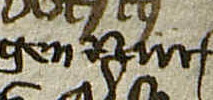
gen Nür*
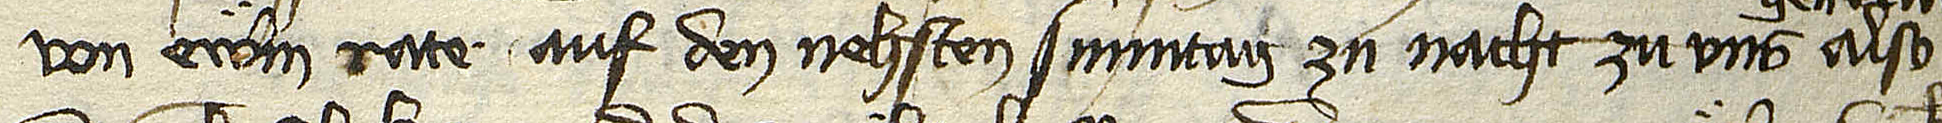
von eẅ*m rate . auf den nehſten ſunntag ʒu nacht ʒu vns alſo
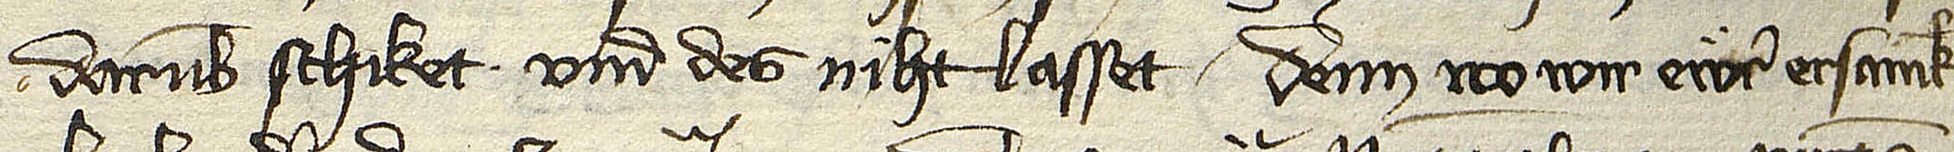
darub* ſchiket . vnd des niht laſſet / Denn wo wir eẅr* erſamk*
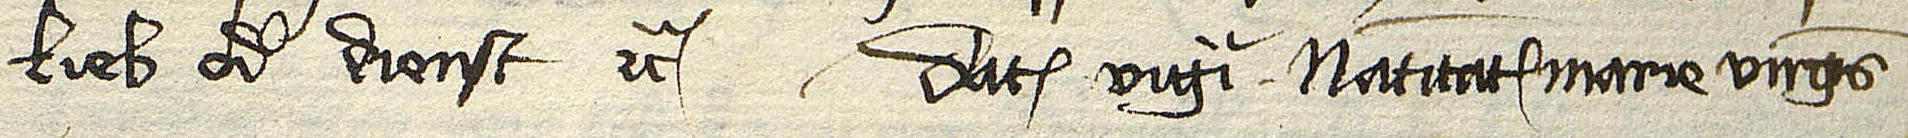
Lieb od* dienſt ec* / Dat vigi* . Natitat* marie virgis*
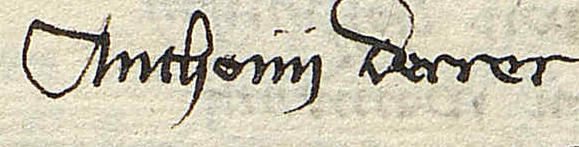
Anthonii Derrer
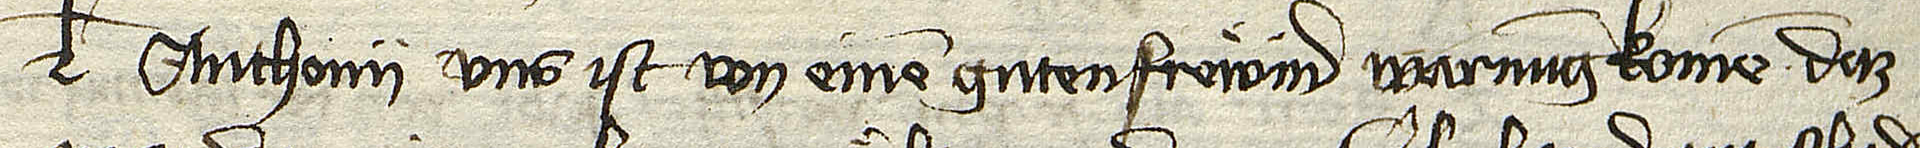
L* Anthonii vns iſt von eine* guten freẅnd warnug* kome* . daʒ
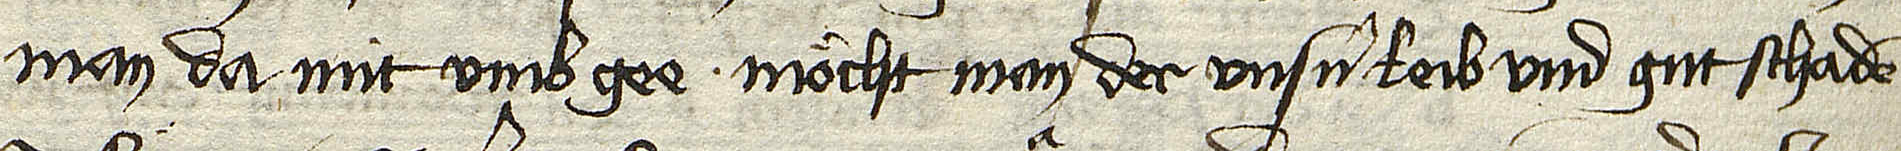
man da mit vmb gee . möcht man der vnſ*n leib vnd gut ſchade*
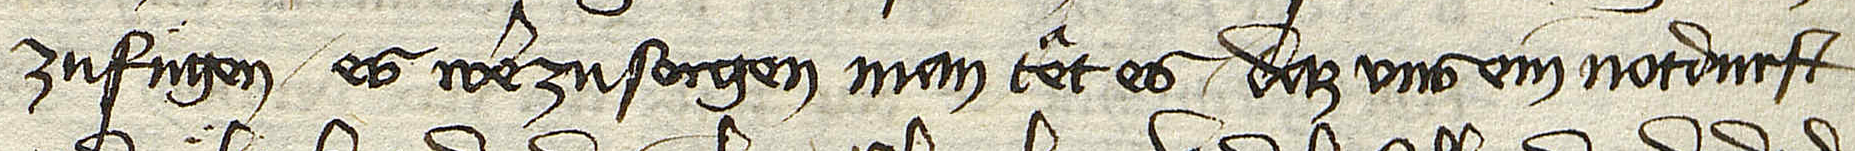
ʒufügen / es we* ʒu ſorgen man tët es / daʒ vns ein notdurft
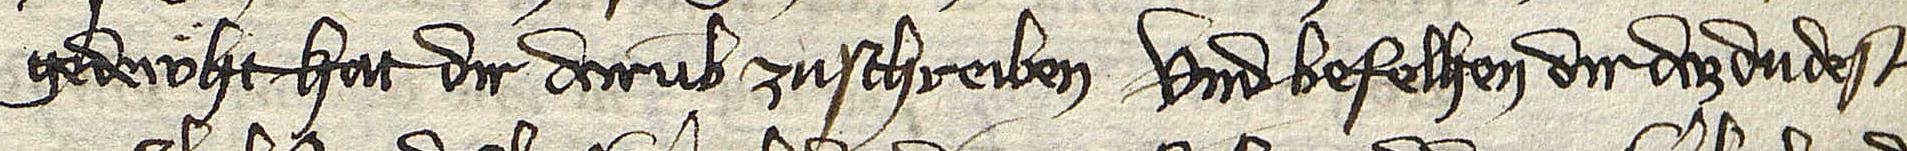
gedewht hat dir darub* ʒuſchreiben / Vnd befelhen dir daʒ du deſt
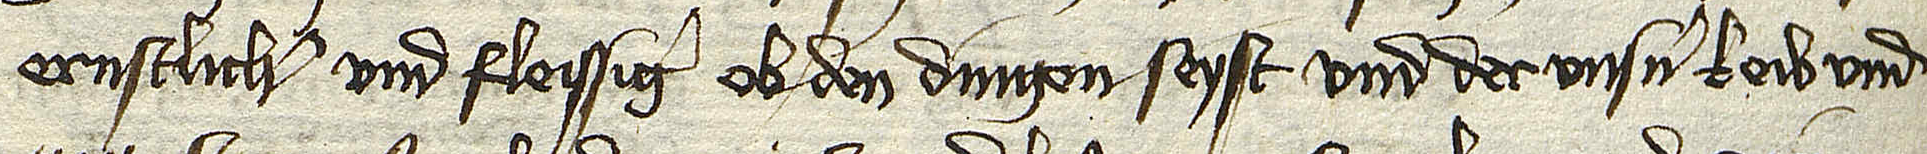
ernſtlich* vnd fleiſſig* ob den dingen ſeyſt vnd der vnſ*n leib vnd
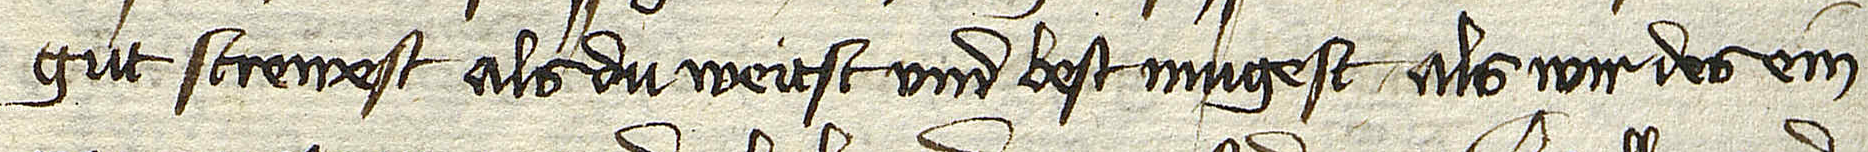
gut ſtreweſt als du weitſt vnd beſt mugeſt / als wir des ein
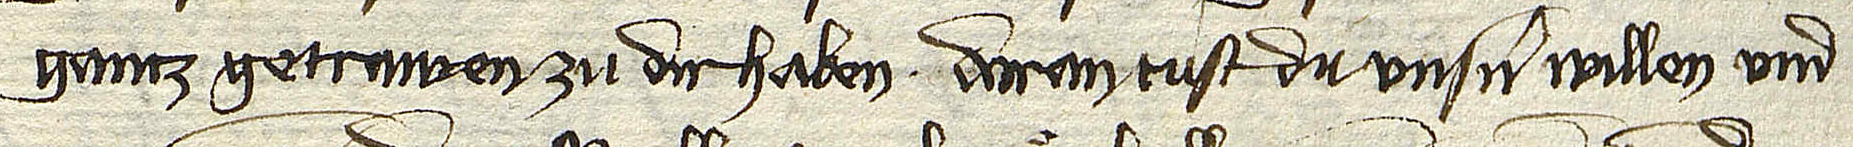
gancʒ getrawen ʒu dir haben . Daran tuſt du vnſ*n willen vnd
